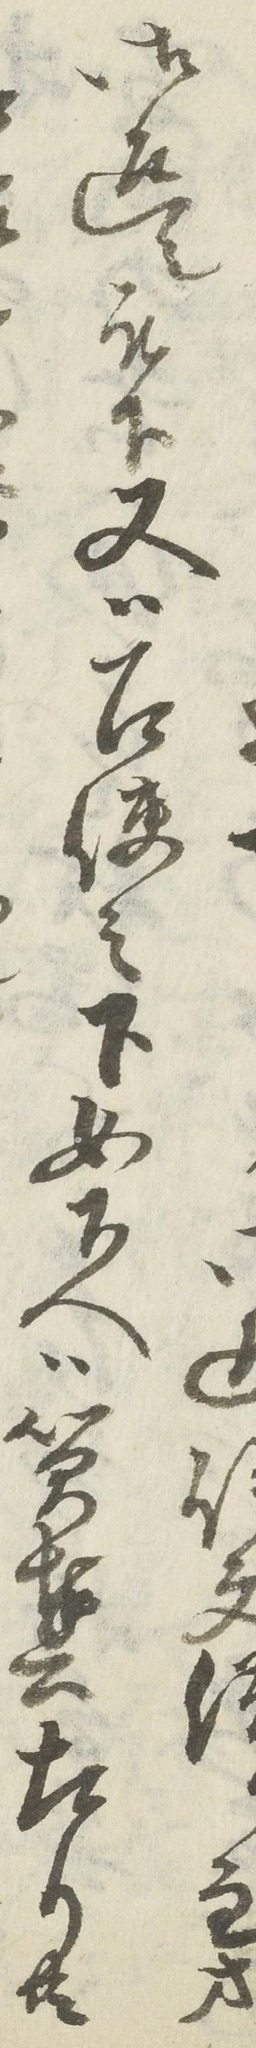御返シ被下又は召使之下女下人は節奉公たり共
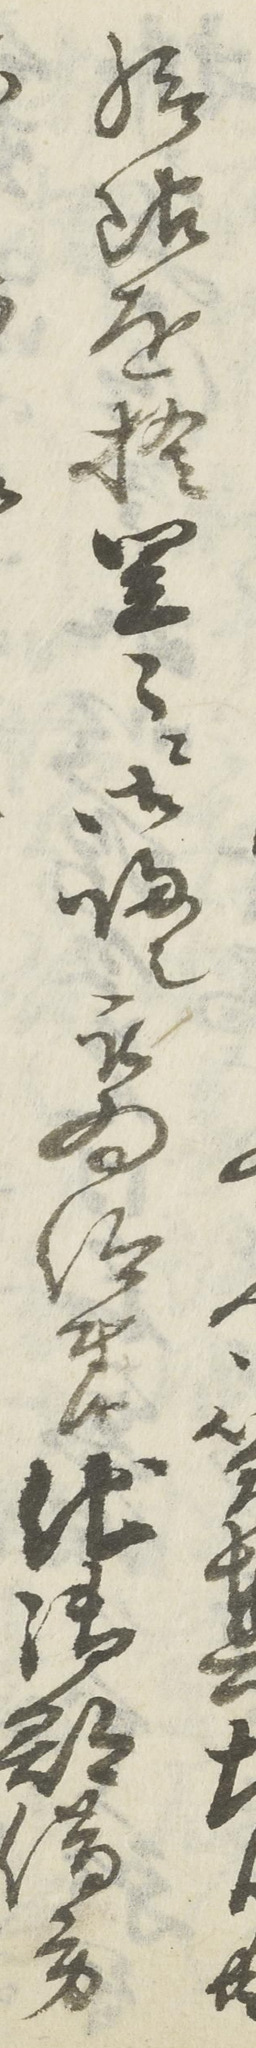給銀を捨里々ニ御帰シ被為仰付候他御郡借方
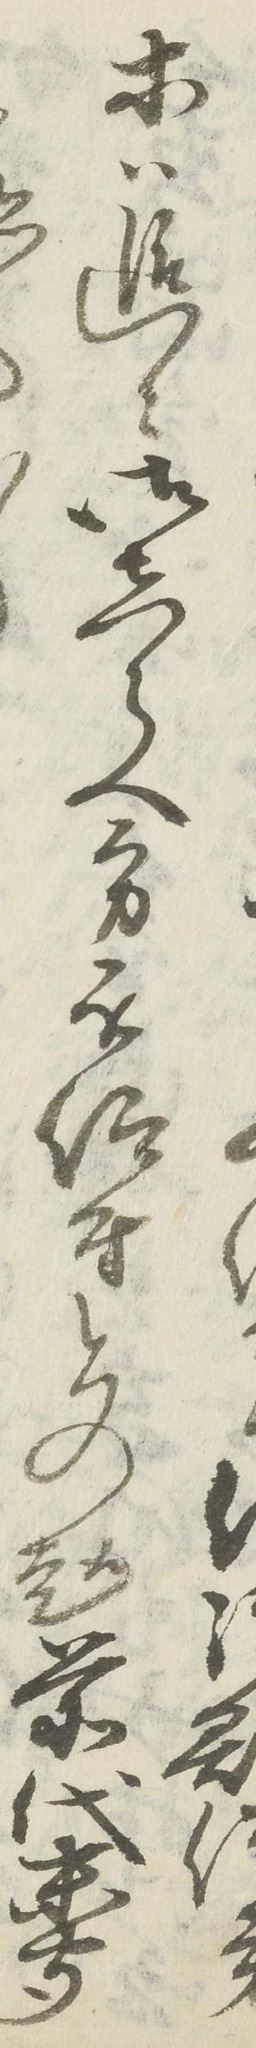等は追々御しらへ方被仰付との趣前代未聞
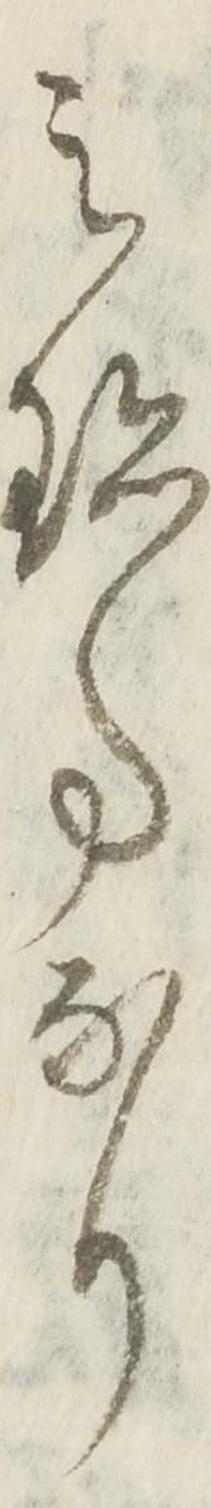の珍事なり
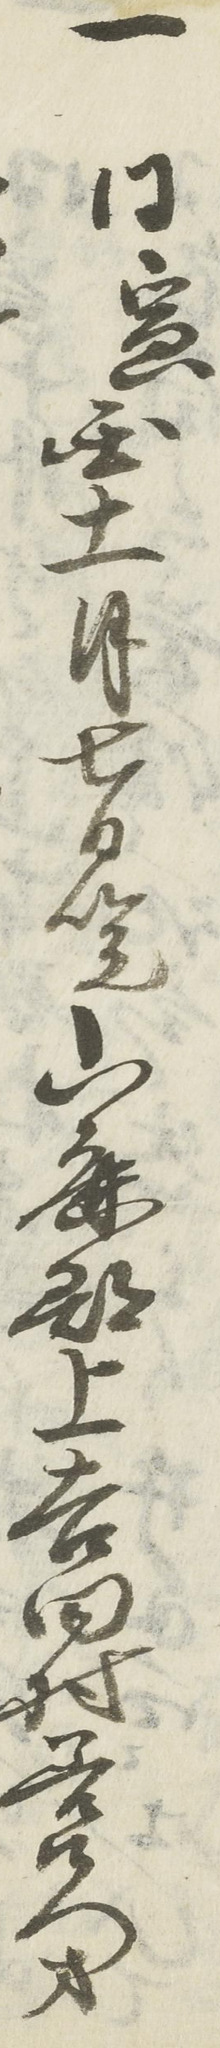一同寅閏十一月七日晩山鹿郡上吉田村善左衛門方
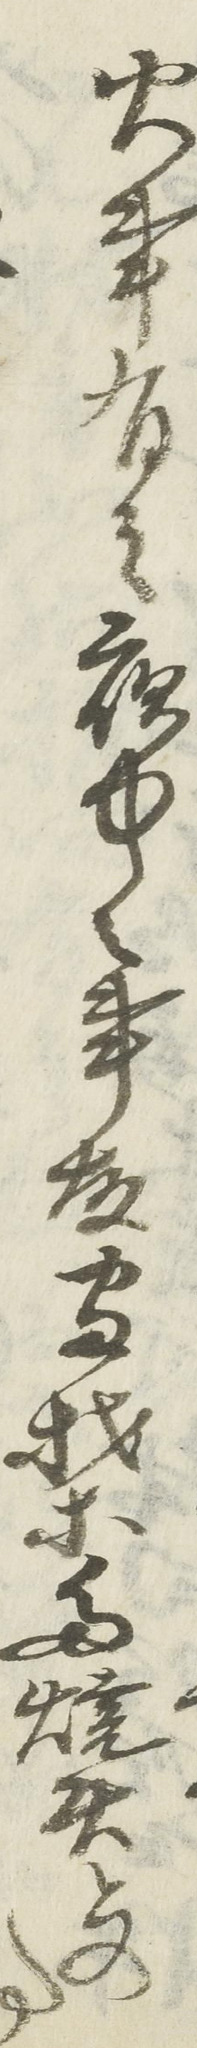火事有之夜中之事故家我等多焼失との事
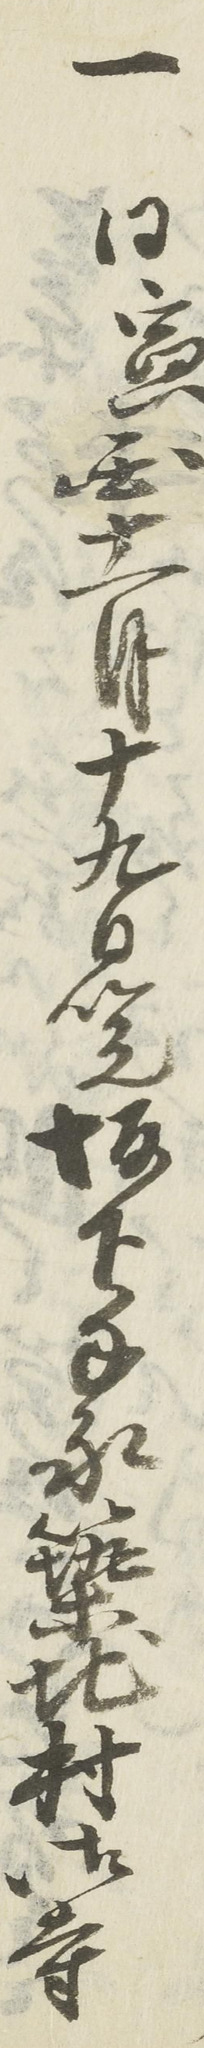一同寅閏十一月十九日晩坂下手永築地村御寺
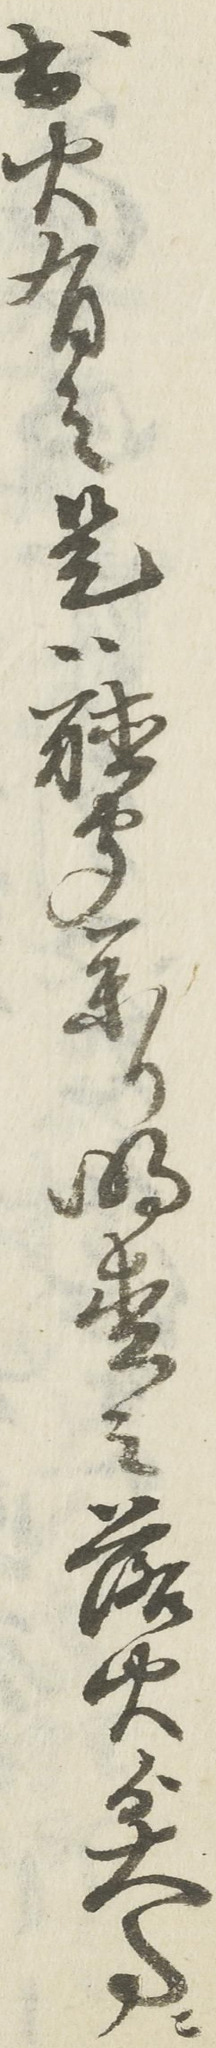出火有之是は聴聞参り明枩之落火ゟ大事ニ
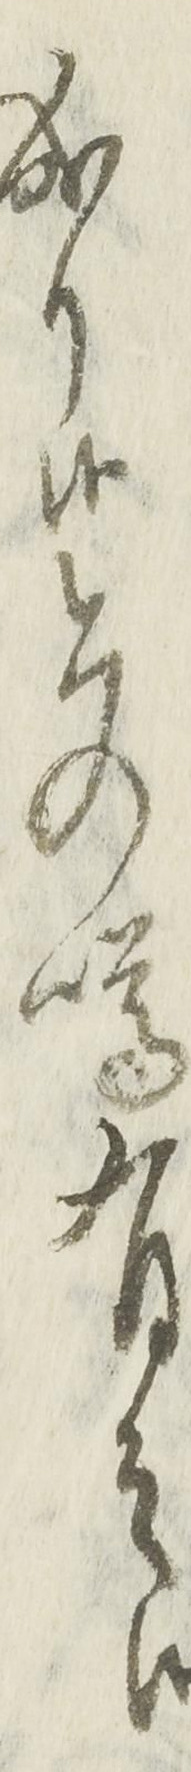成り候との噂有之候
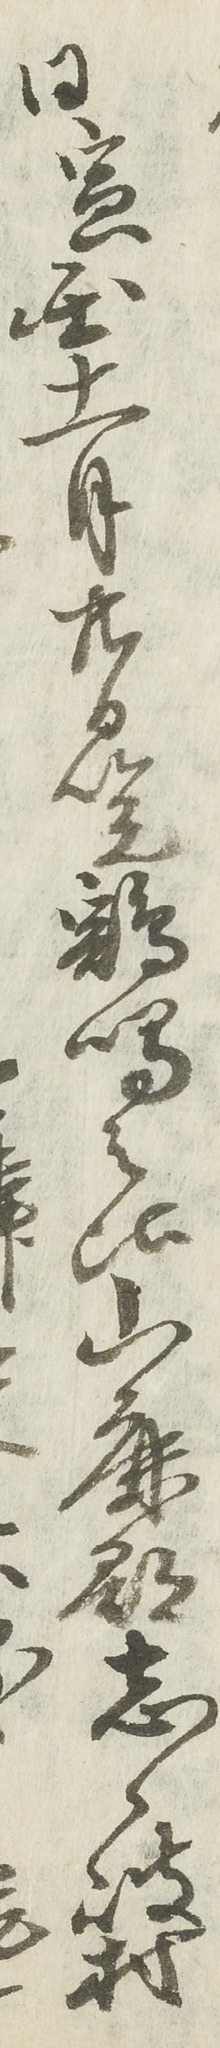一同寅閏十一月廿日晩鶴鳴之頃山鹿郡しゝ岐村
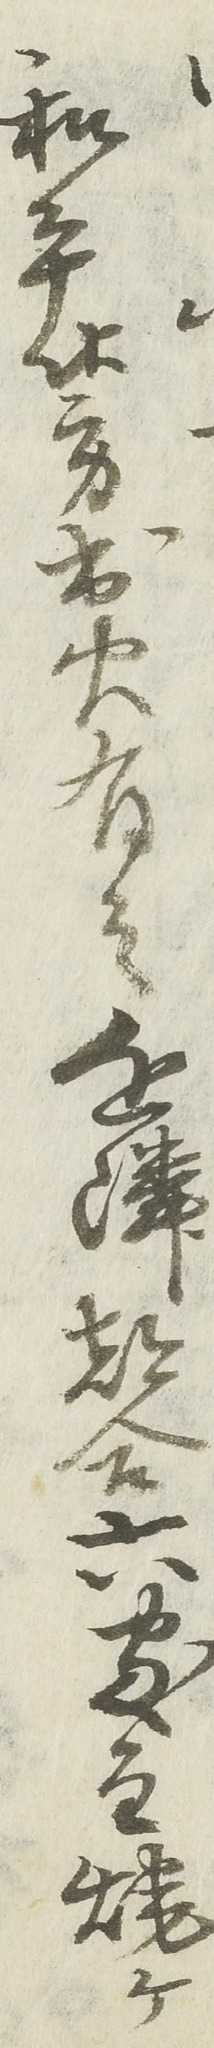和平次方出火有之近隣都合六家主焼ケ
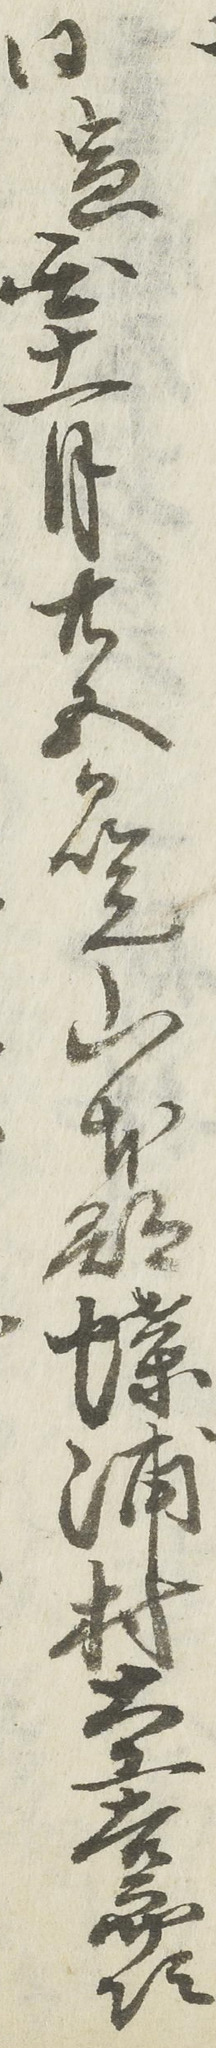一同寅閏十一月廿五日晩山本郡蝶浦村大工吉郎次
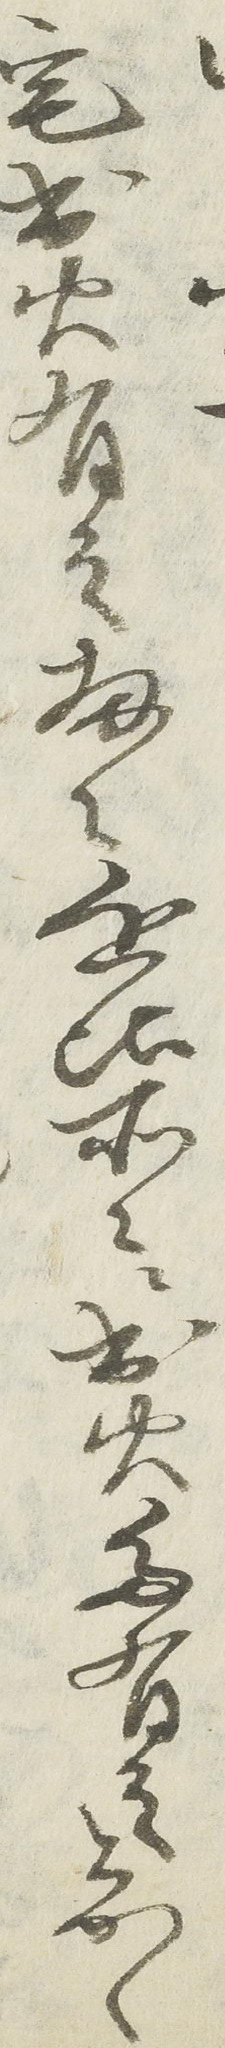宅出火有之扨々近比所々ニ出火多有之とかく
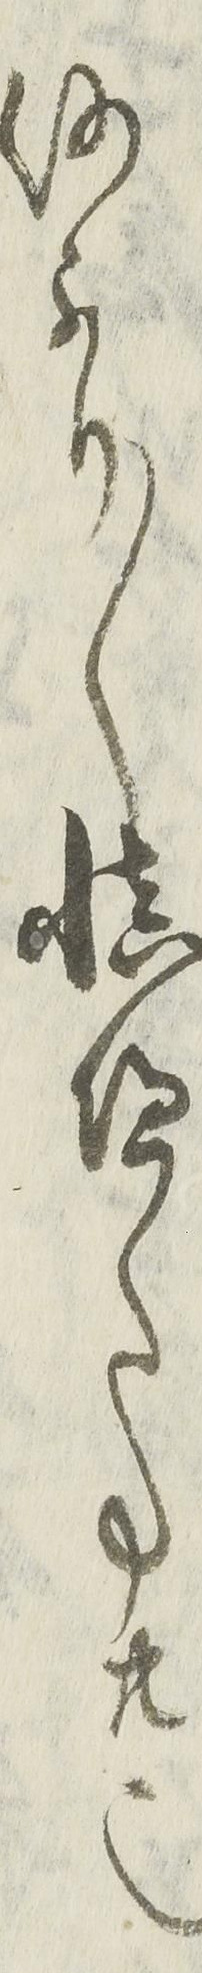何より〳〵慎へく事共也
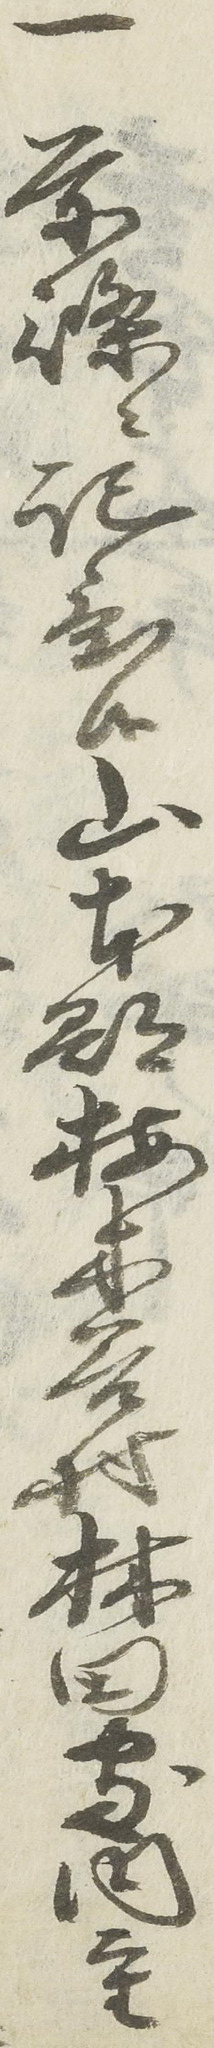一前条ニ記置候山本郡梅木谷村林田家内重
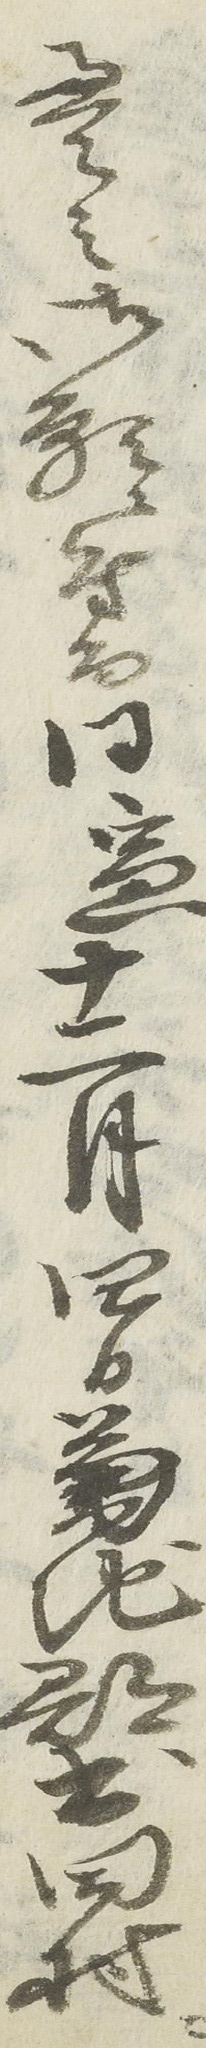畳之御願ニ付而同寅十二月四日菊池郡出田村ニ
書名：後見笑
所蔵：東京大学地震研究所図書室 Earthquake Research Institute Library, The University of Tokyo, JAPAN
